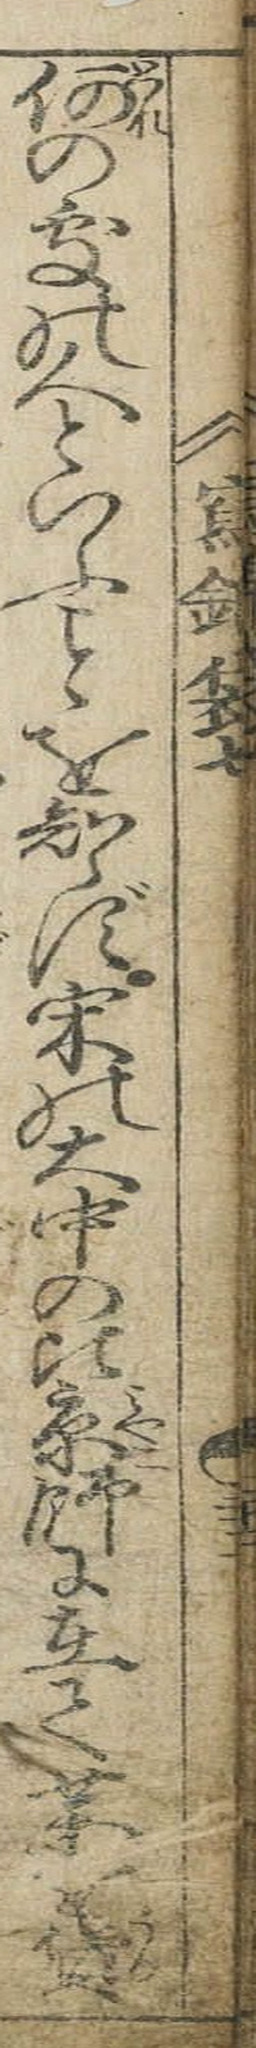何の処の人といふことを知らず。宋の大中の比京師に在て薬を貨
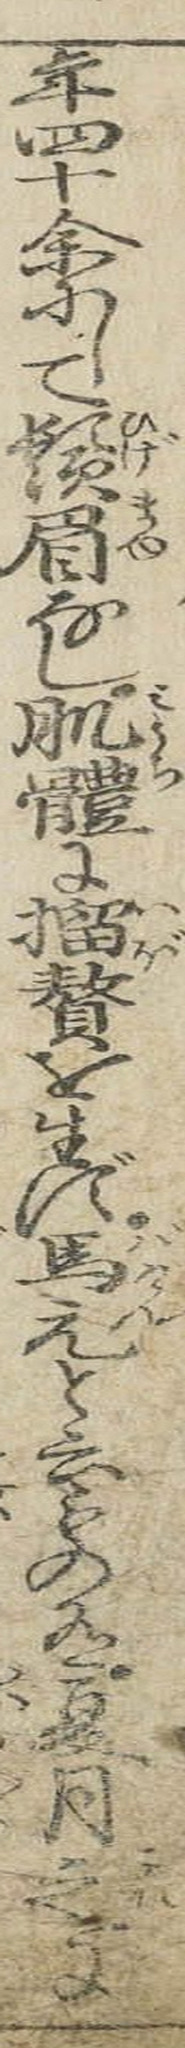年四十余にして鬚眉なし。肌体に㨨贅を生ず。馬元と云もの有。夏月之に
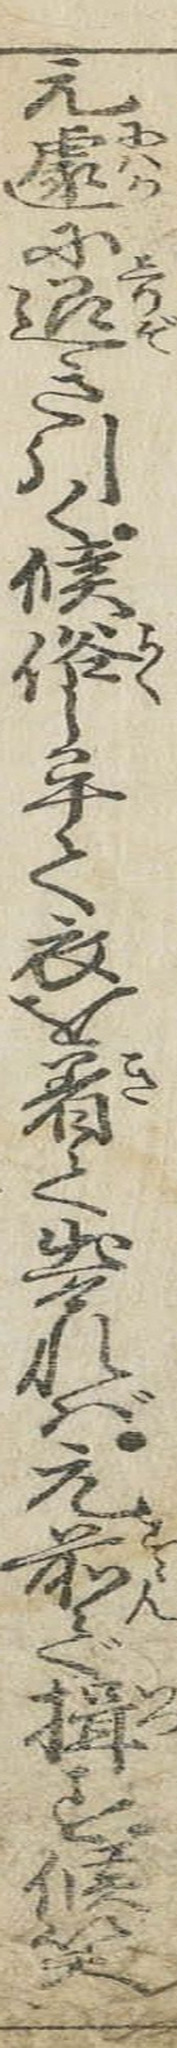元遽に退き引く。候浴し畢て衣を着て出ければ。元前で揖す。候笑
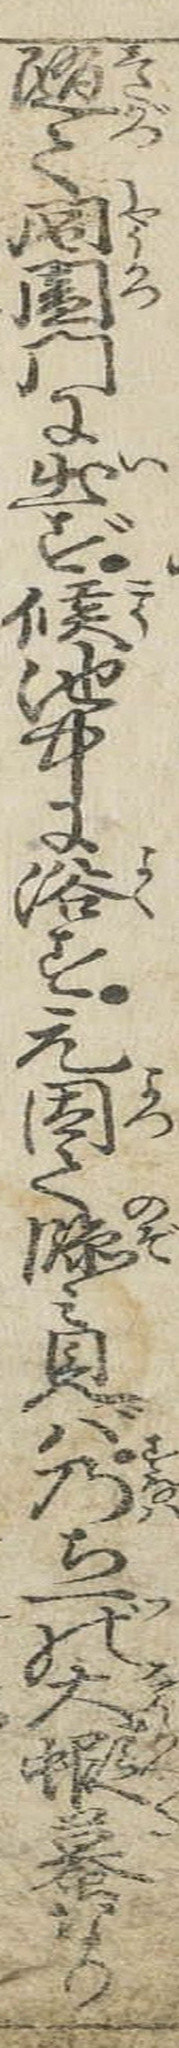随て閶闔門に出ず。候池中に浴す。元因て臨み見ば。乃ち一の大蝦蟇なり
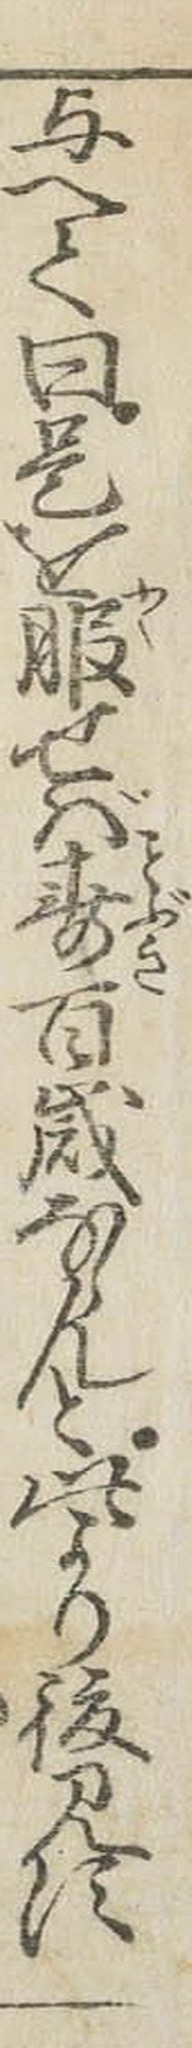与へて曰。是を服せば寿百歳ならんと。此より後見す
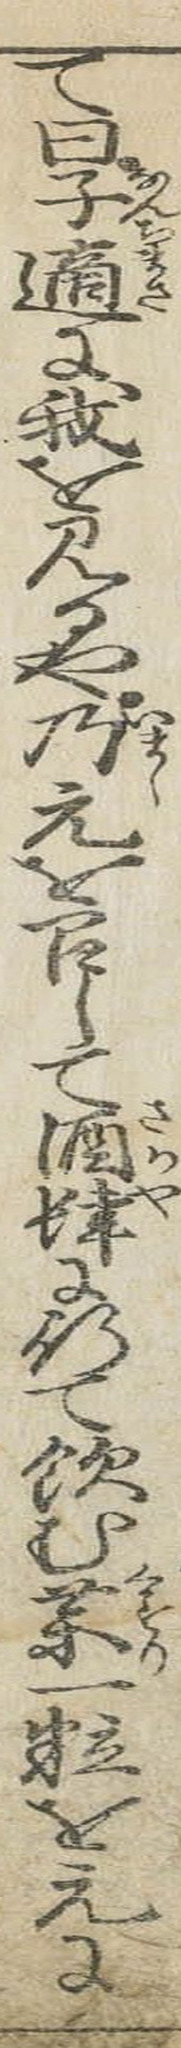て曰。子適に我を見るや。乃元を召して酒肆に行て飲む薬一粒を元に
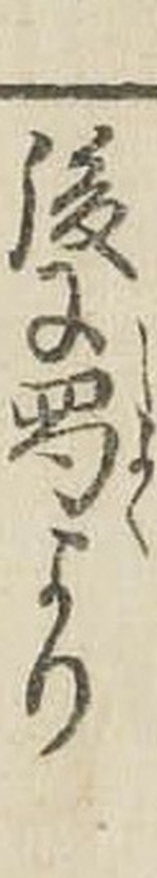後に蜀より
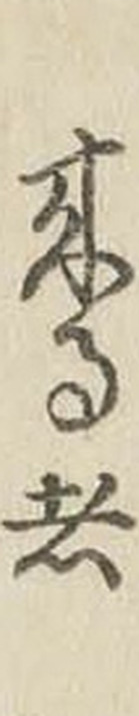来る者
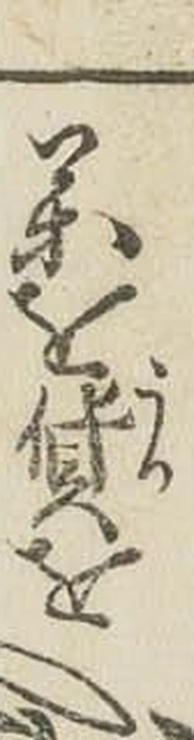薬を貨を
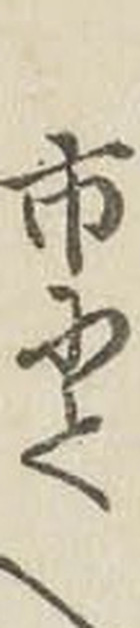市にて
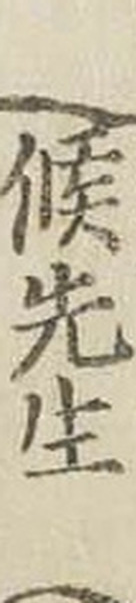候先生

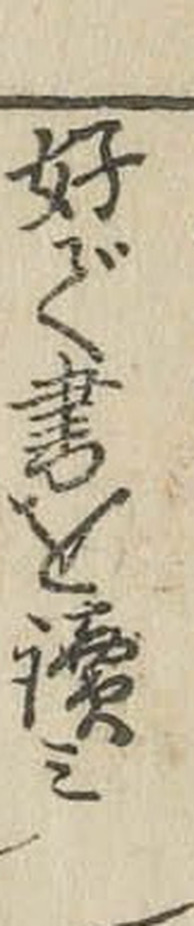好で書を読み
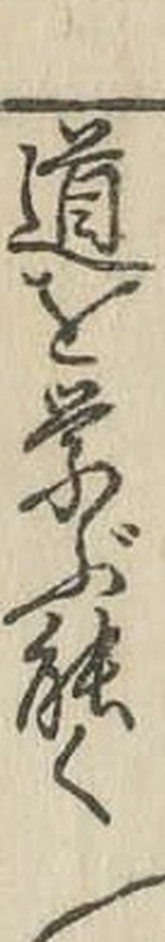道を学ぶ能く
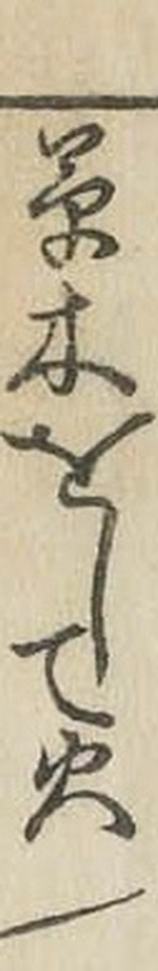草木をして火
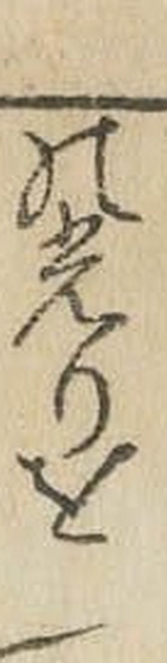の光りを
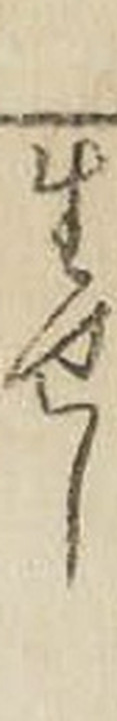生ぜし
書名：絵本写宝袋 9巻 7之巻
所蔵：東京学芸大学教育コンテンツアーカイブ
